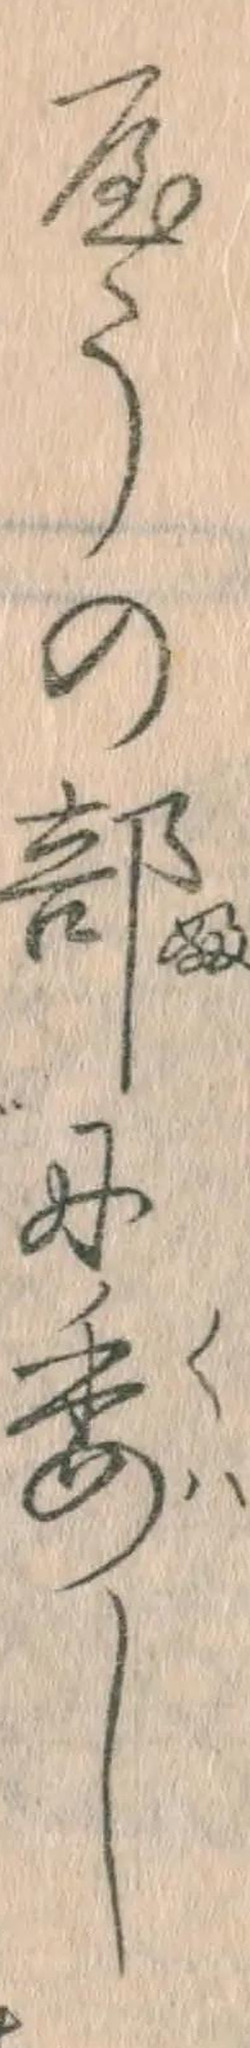やうの部に委し
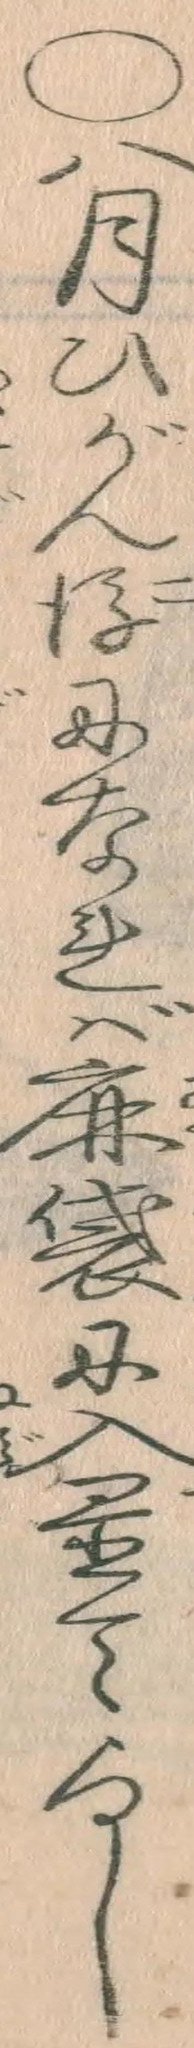○八月ひがん後になれば麻袋に入置えよし
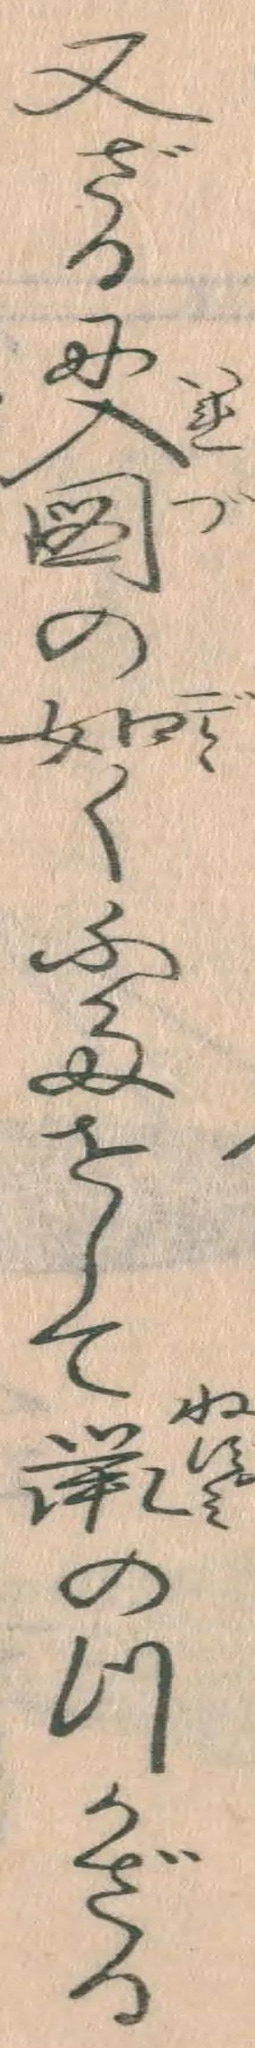又ざるに入図の如くふたをして鼠のつかざる
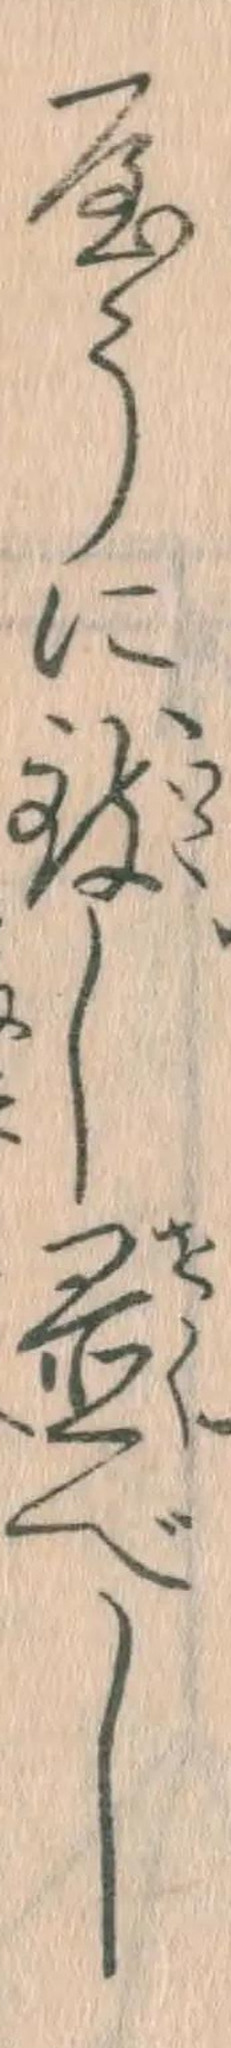やうに致しし置べし
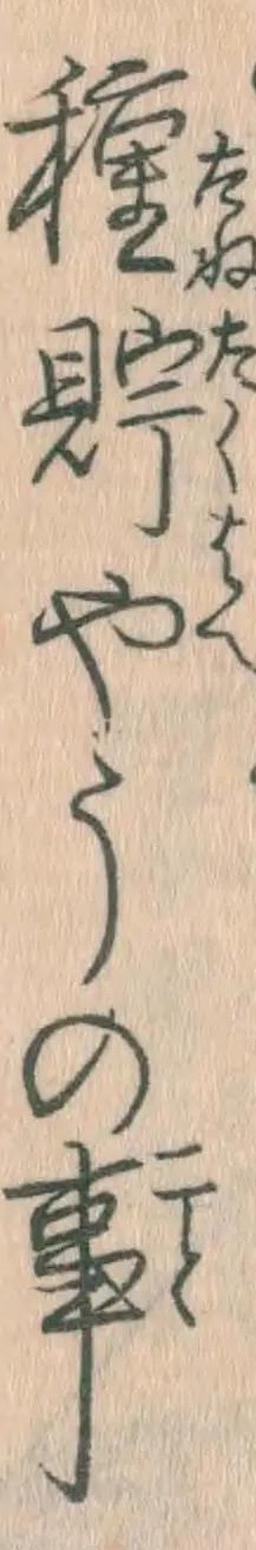種貯やうの事
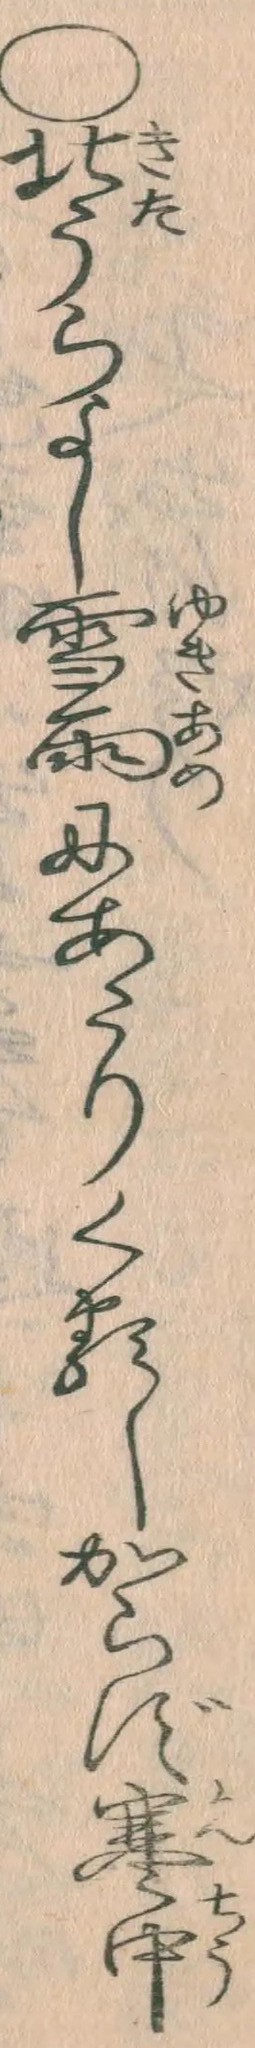○北うらよし雪雨にあたりくるしからず寒中
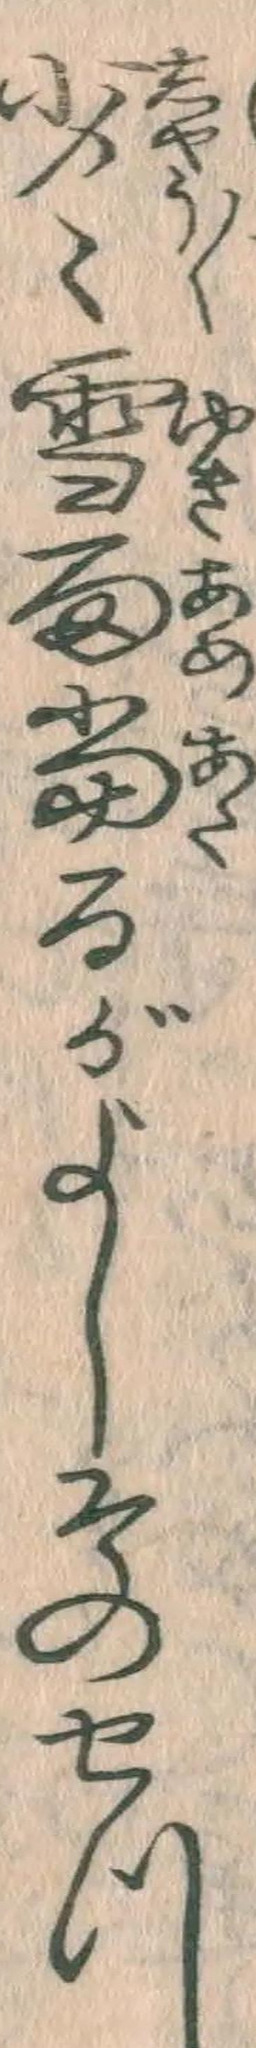少々雪雨当るがよしそのせつ
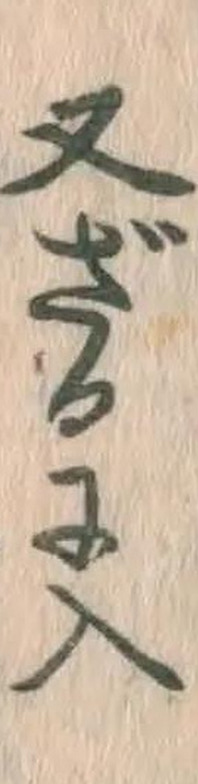又ざるに入
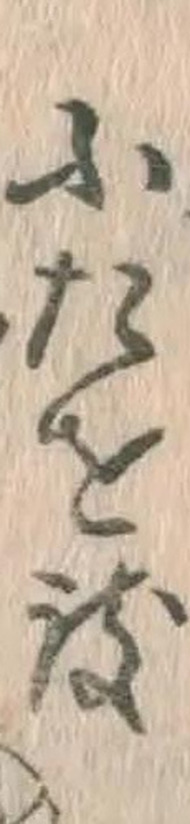ふたを致
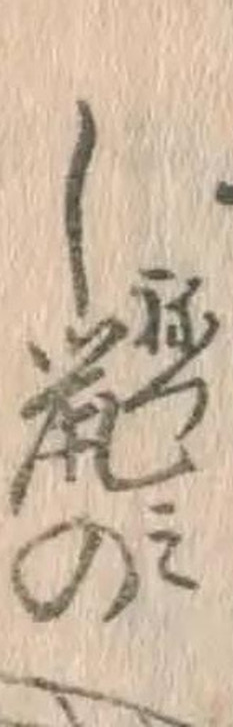し鼠の
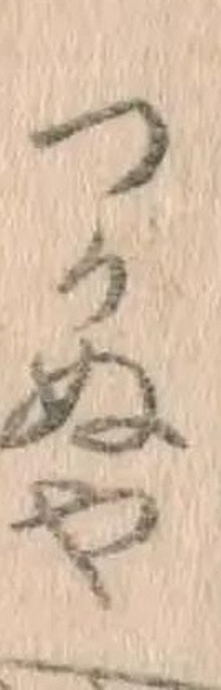つかぬや
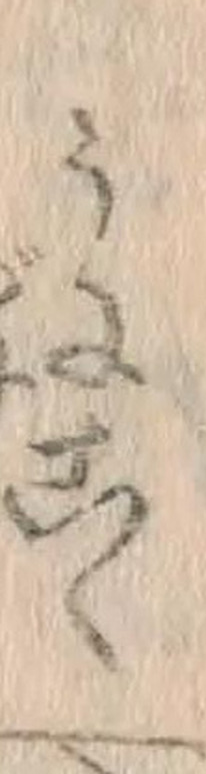うにこゝ
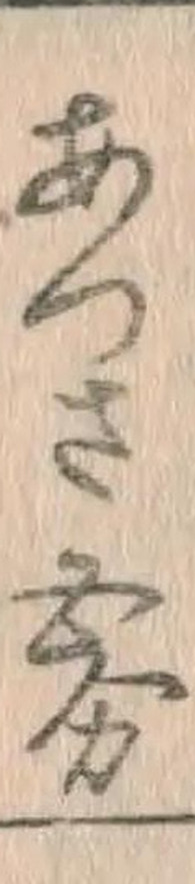あつさ五分
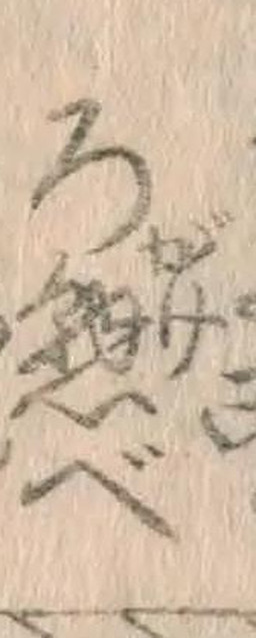ろ懸べ
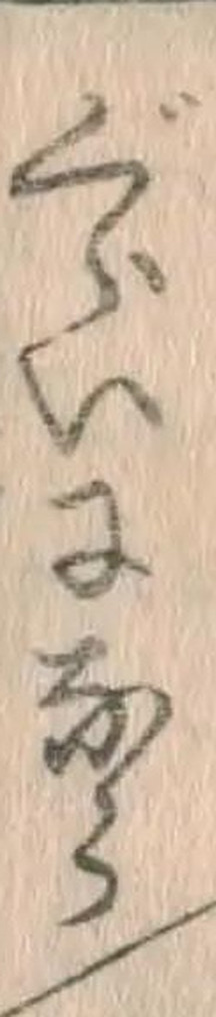くらいになら
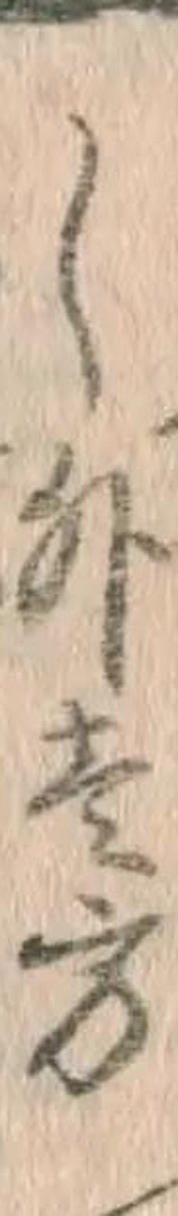し外壱方
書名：山繭養法秘傳抄
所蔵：国立国会図書館 National Diet Library, JAPAN
